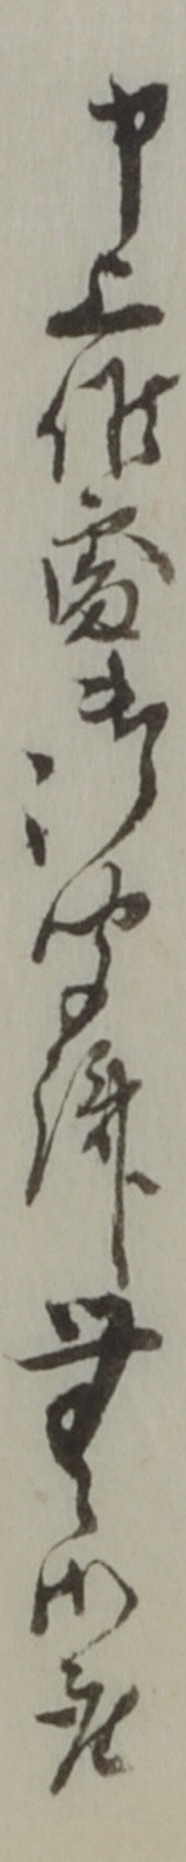申上候処御聞済無御座
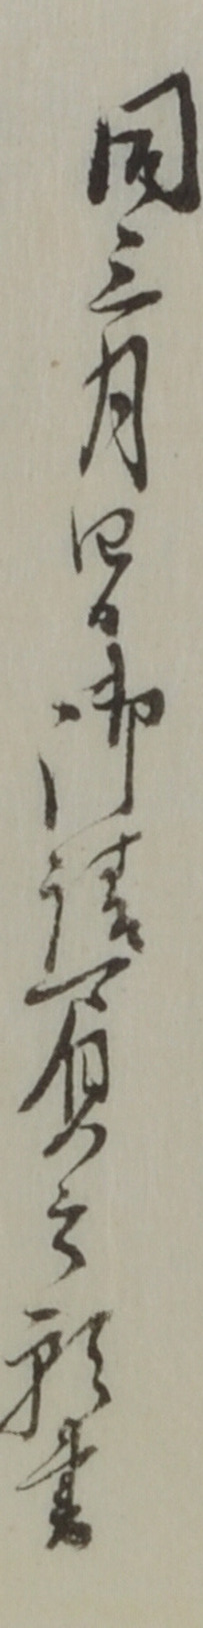同三月四日御請負之願書
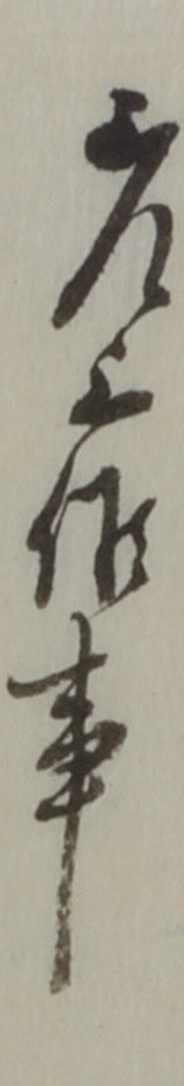差上候事
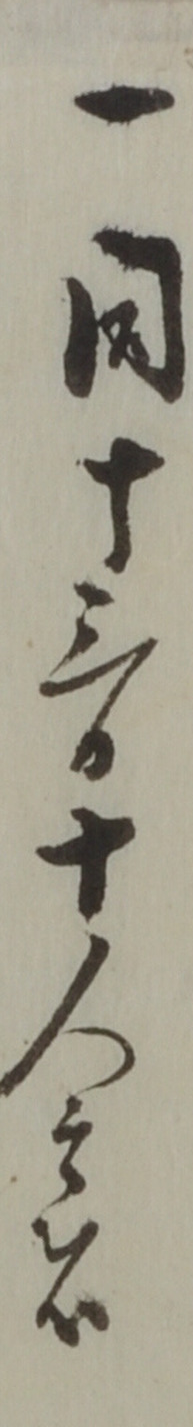一同十三日十人之者
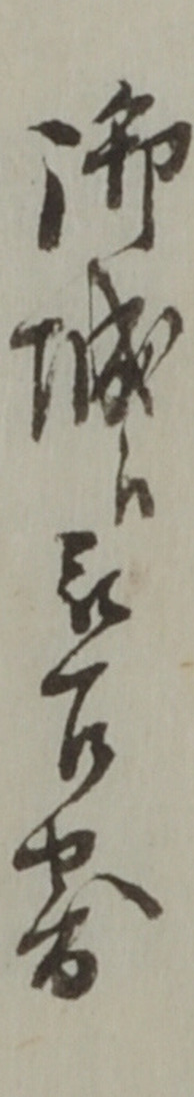御城江召寄
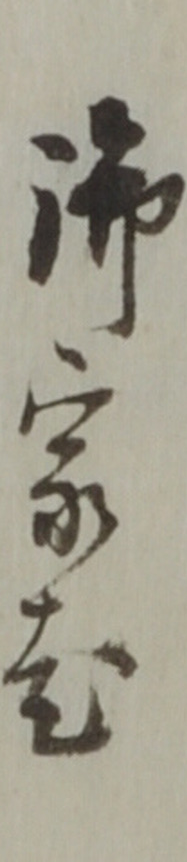御家老
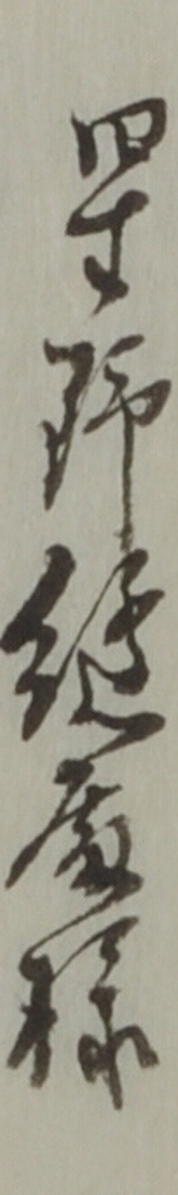星野縫殿様
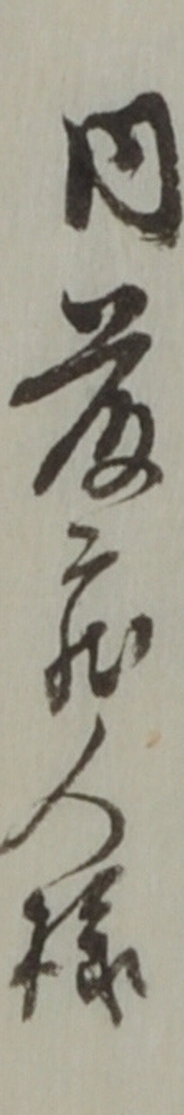内藤蔵人様
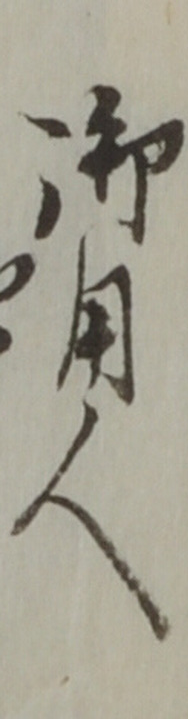御用人
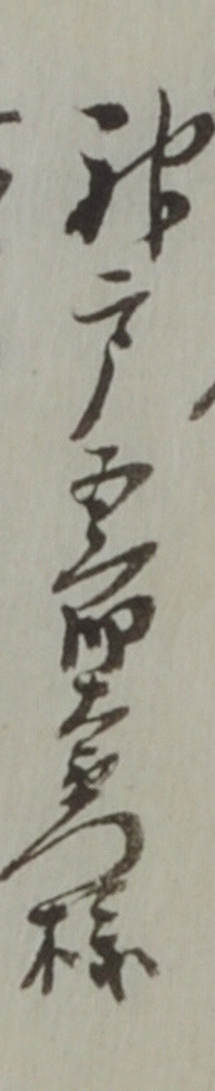神戸五郎右衛門様
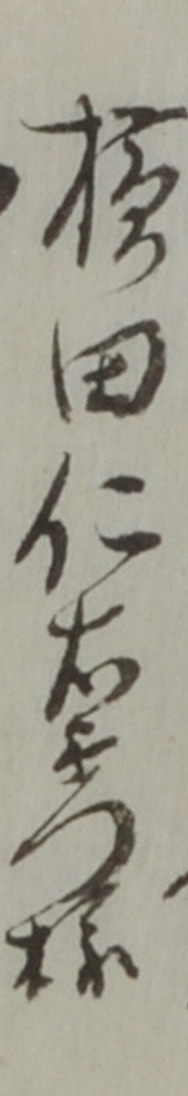横田仁右衛門様
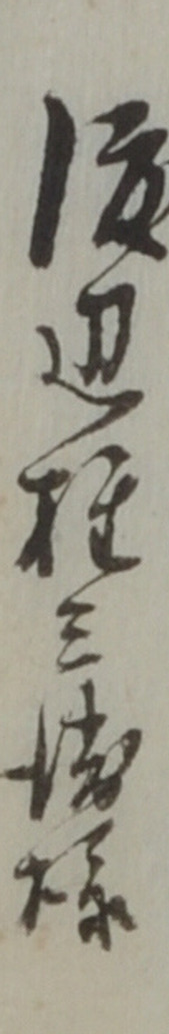渡辺権兵衛様
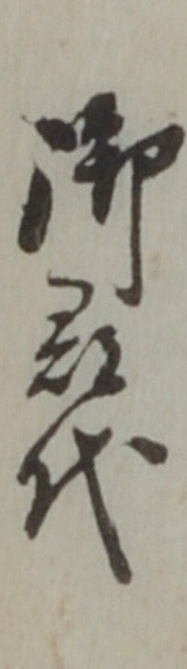御郡代
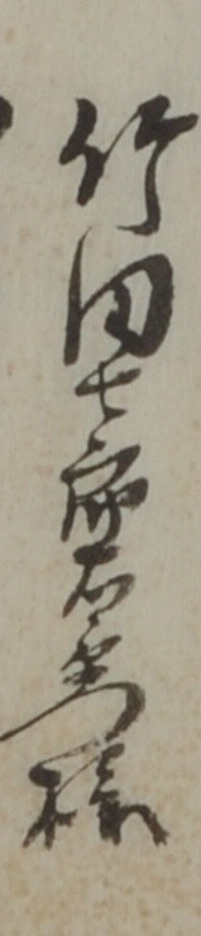竹田七郎右衛門様
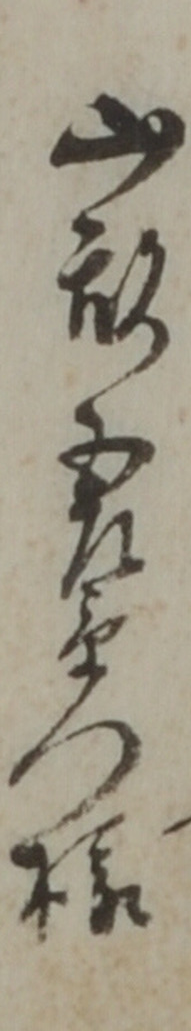山形五左衛門様
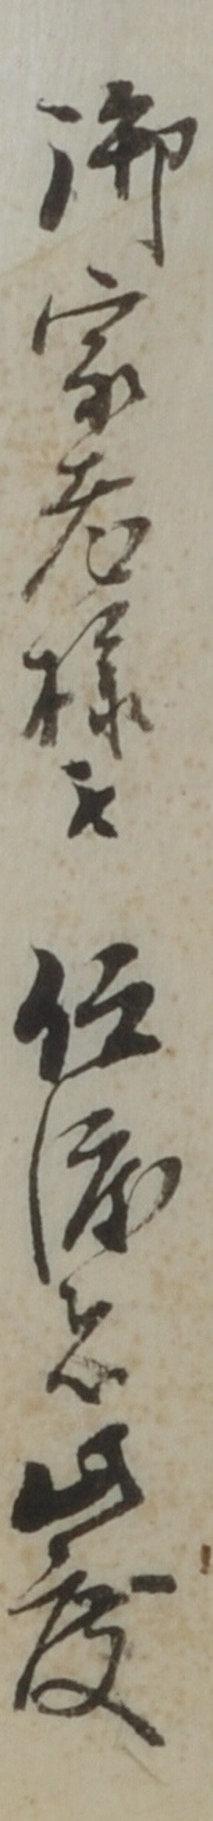御家老様被仰渡者此度
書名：抜書
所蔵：伊那市立高遠町図書館・合同会社AMANE
